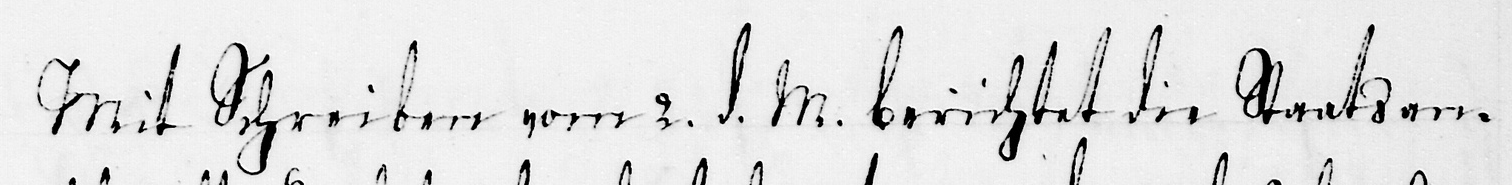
Mit Schreiben vom 2. d. M. berichtet die Staatsan¬
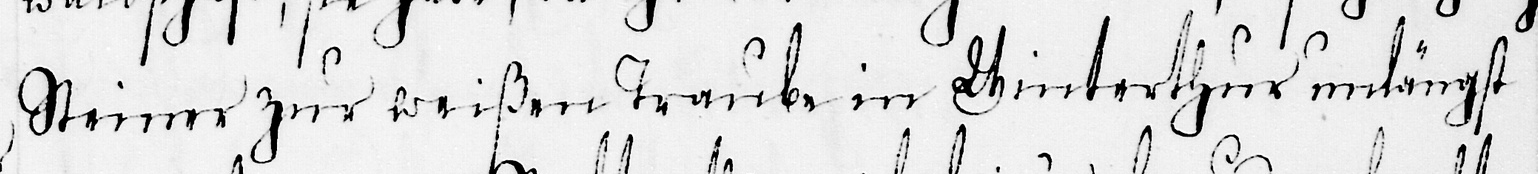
Steiner zur weißen Traube in Winterthur unlängst
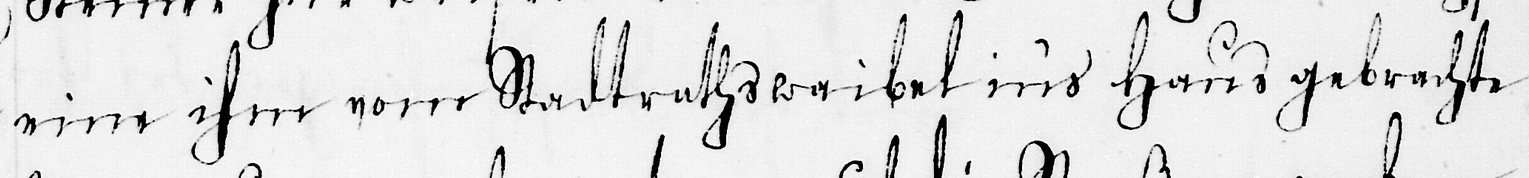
eine ihm vom Stadtrathswaibel in’s Haus gebrachte
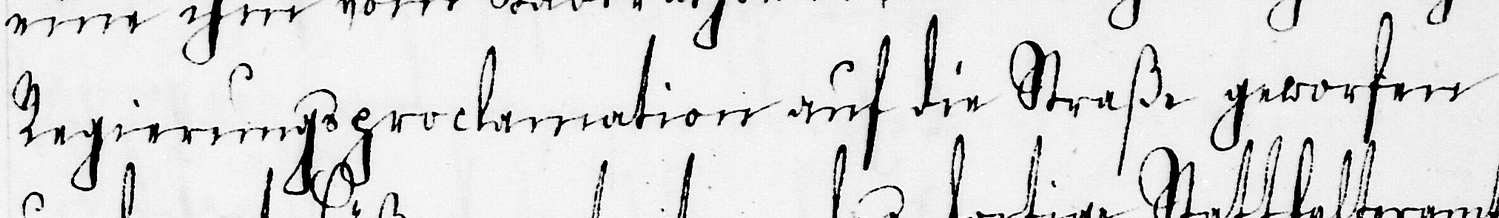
Regierungsproclamation auf die Straße geworfen
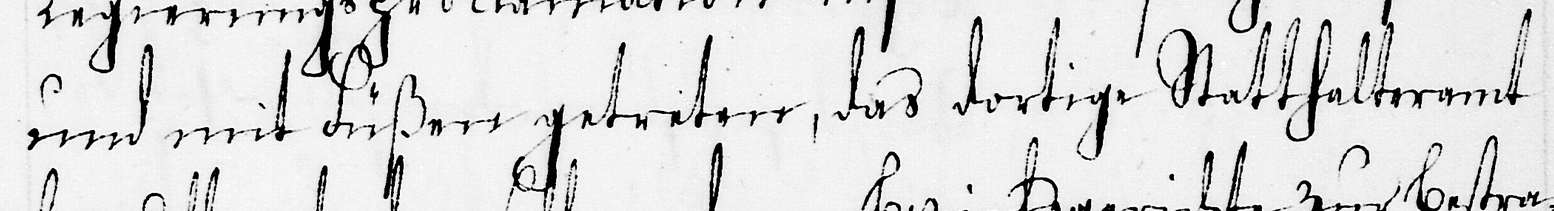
und mit Füßen getreten, das dortige Statthalteramt
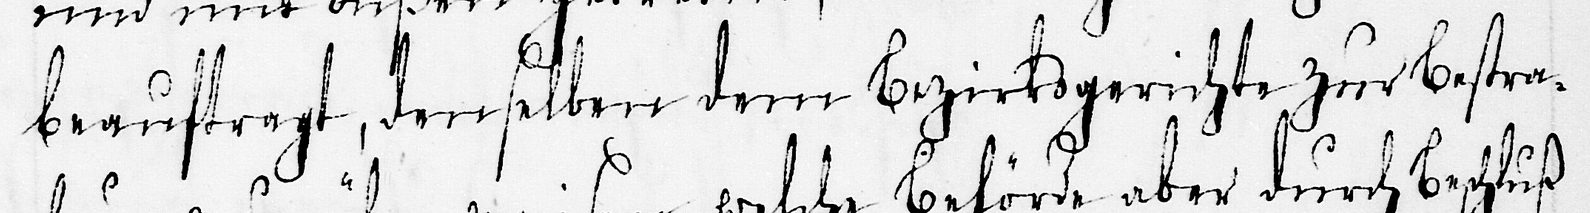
beauftragt, denselben dem Bezirksgerichte zur Bestra¬
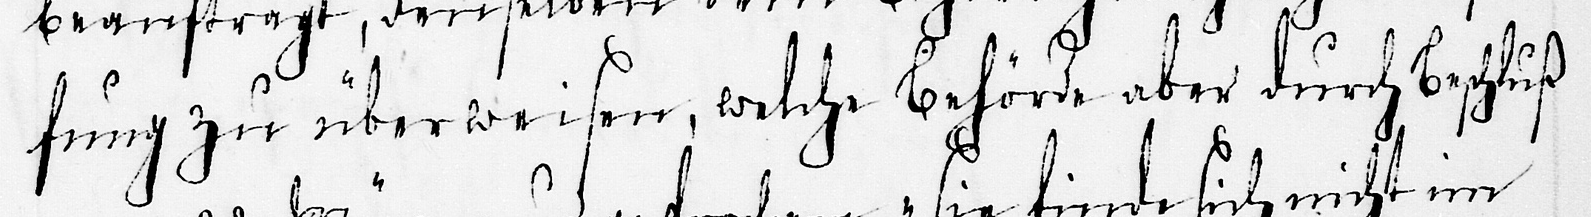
fung zu überweisen, welche Behörde aber durch Beschluß
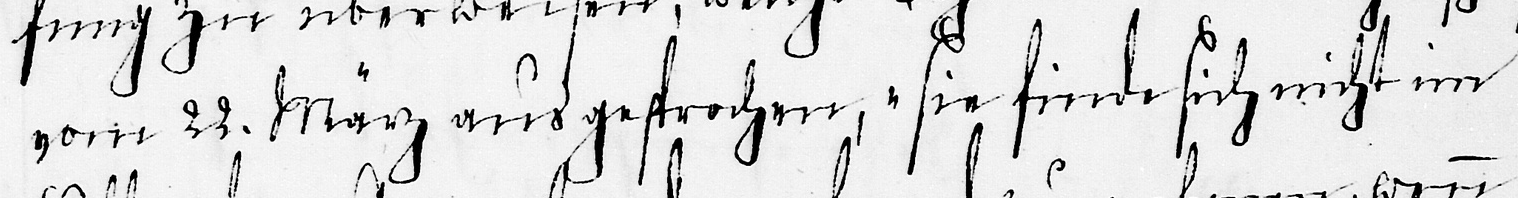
vom 22. März ausgesprochen, „sie finde sich nicht im
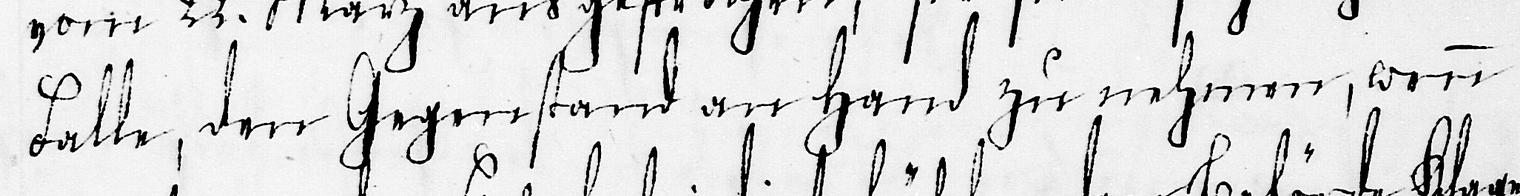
Falle, den Gegenstand an Hand zu nehmen, wenn
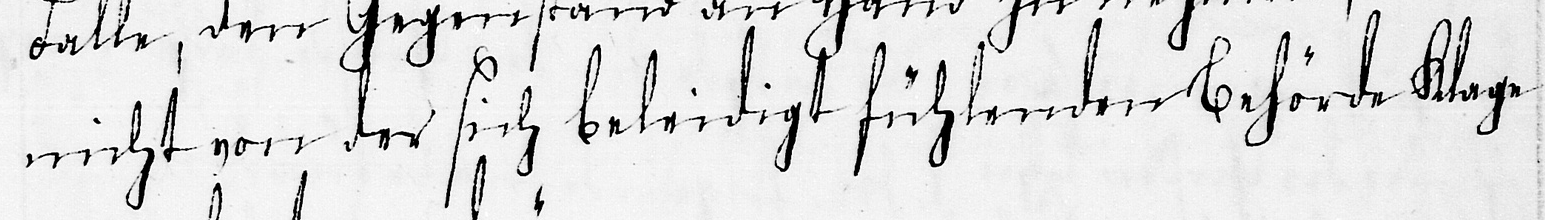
nicht von der sich beleidigt fühlenden Behörde Klage
